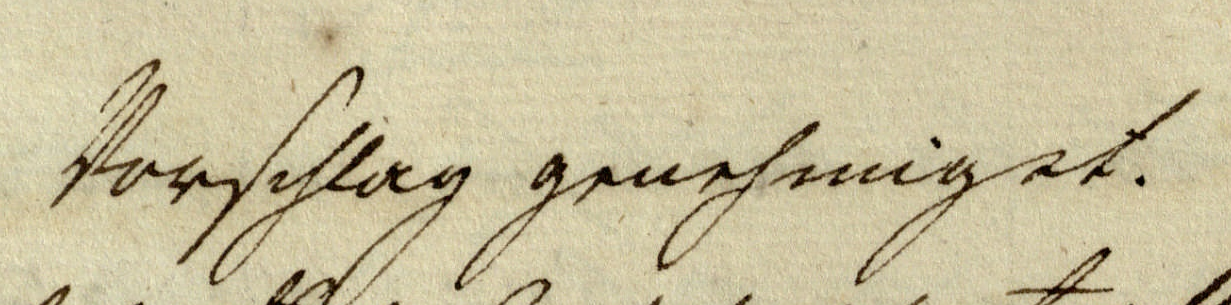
Vorschlag genehmiget.
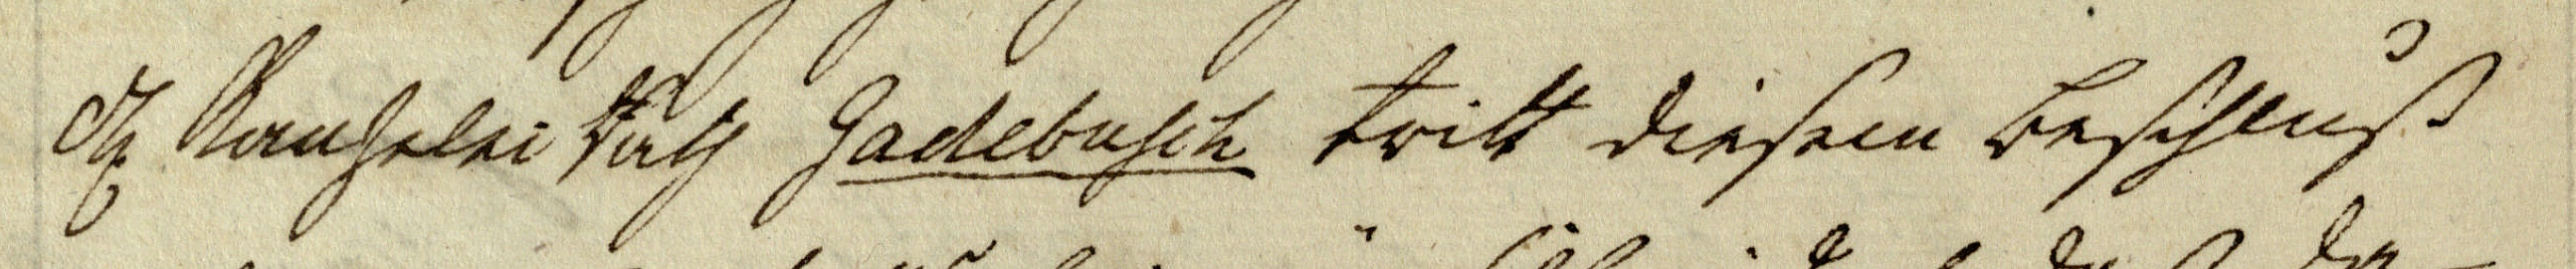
dh. Kanzelei Rath Gadebusch tritt diesem Beschluß
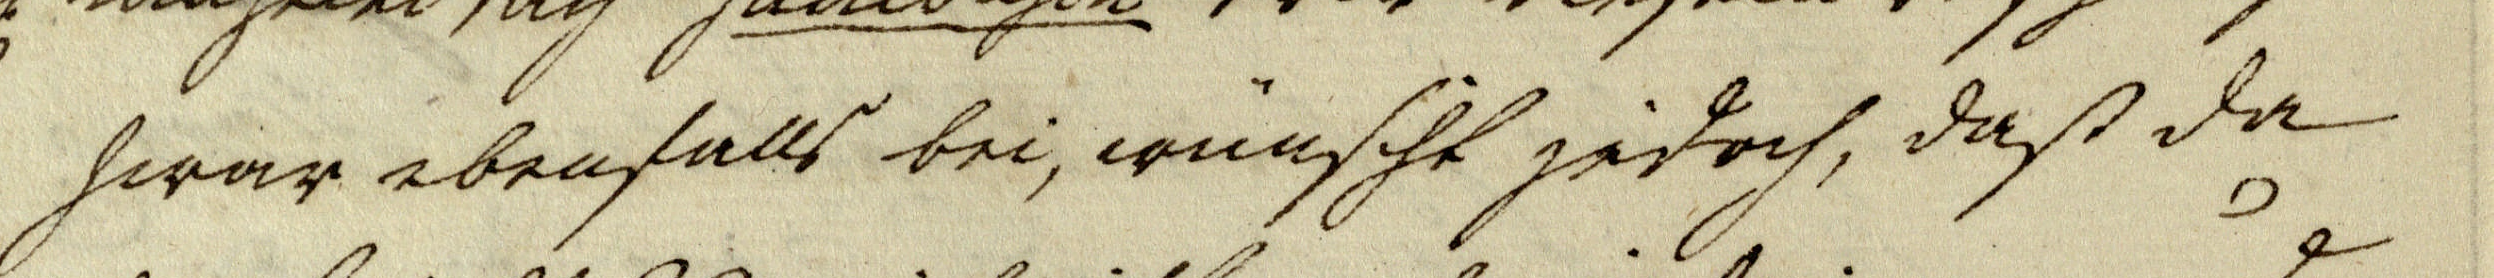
zwar ebenfalls bei, wünscht jedoch, daß da
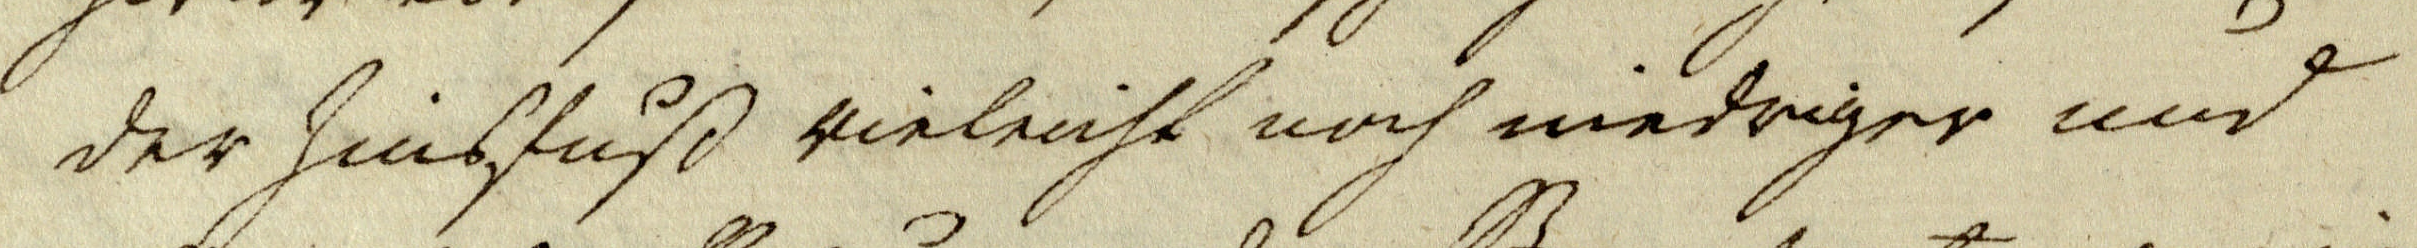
der Zinsfuß vieleicht noch niedriger und
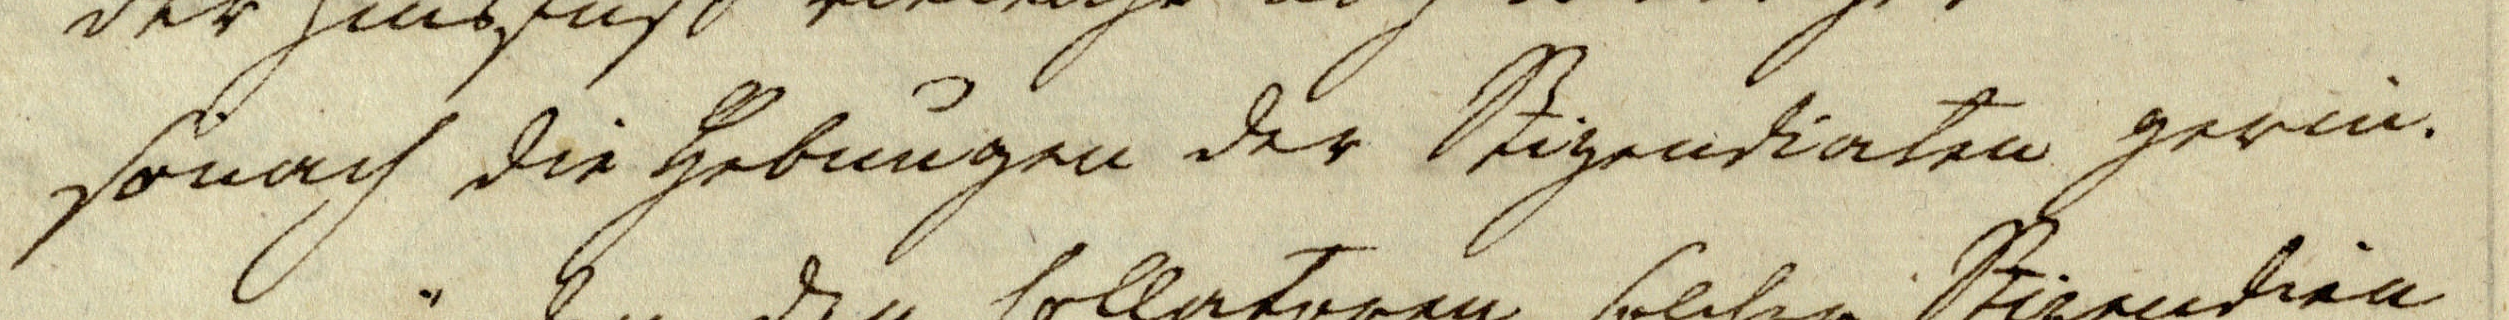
sonach die Hebungen der Stipendiaten gerin¬
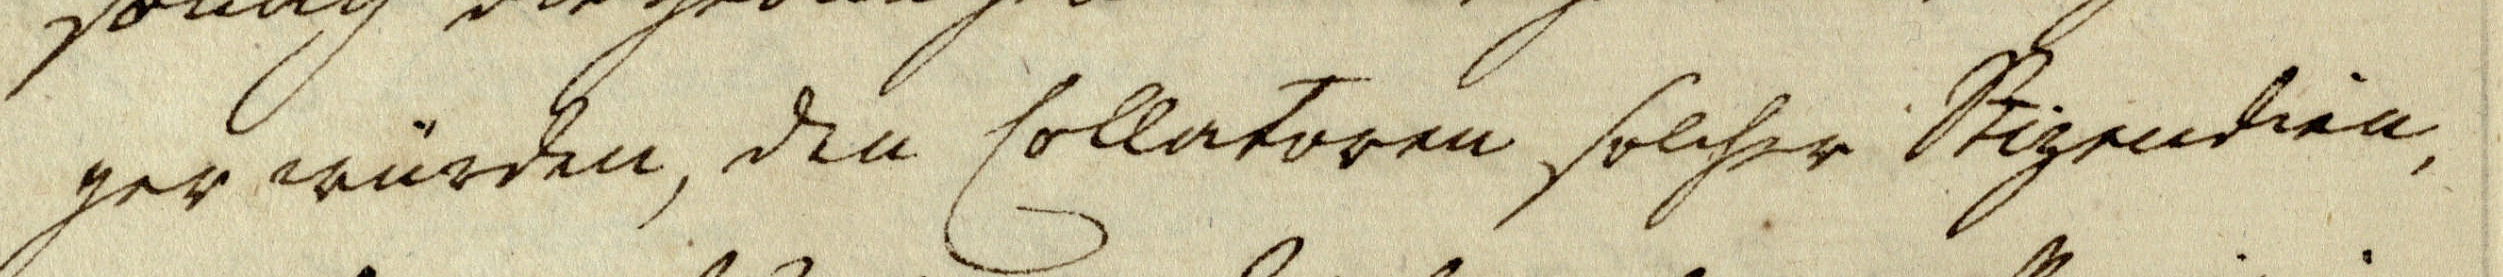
ger würden, den Collatoren solcher Stipendien,
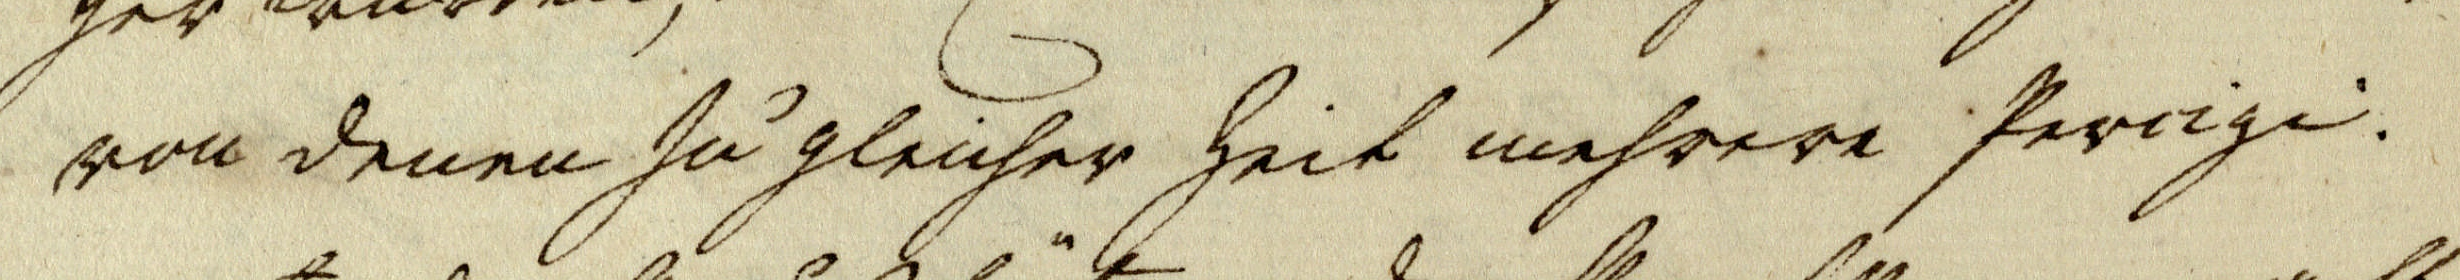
von denen zu gleicher Zeit mehrere Percipi¬
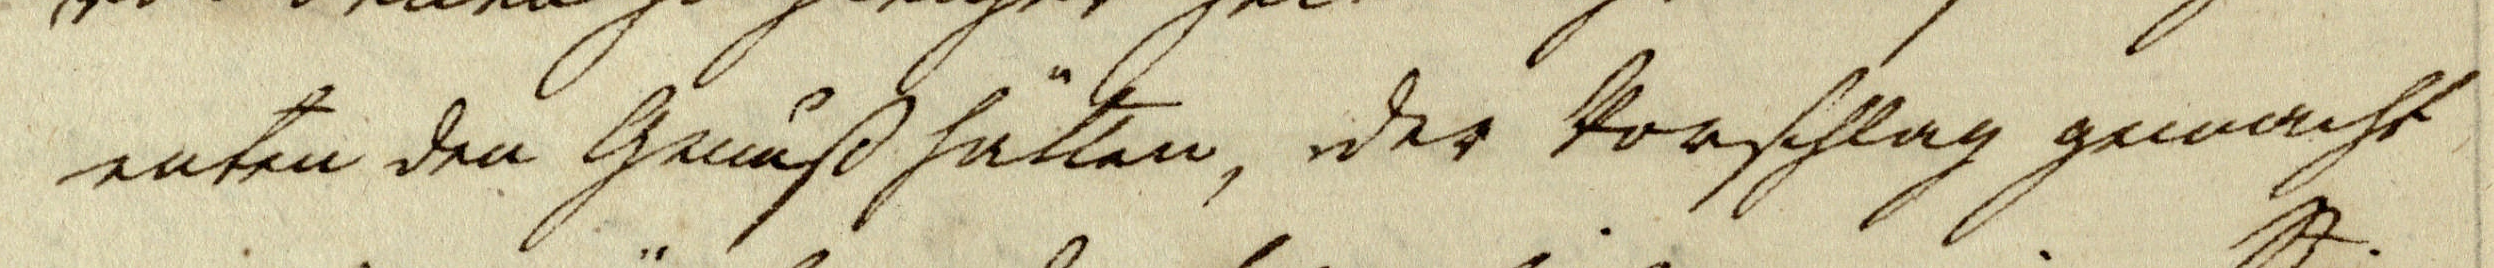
enten den Genuß hätten, der Vorschlag gemacht
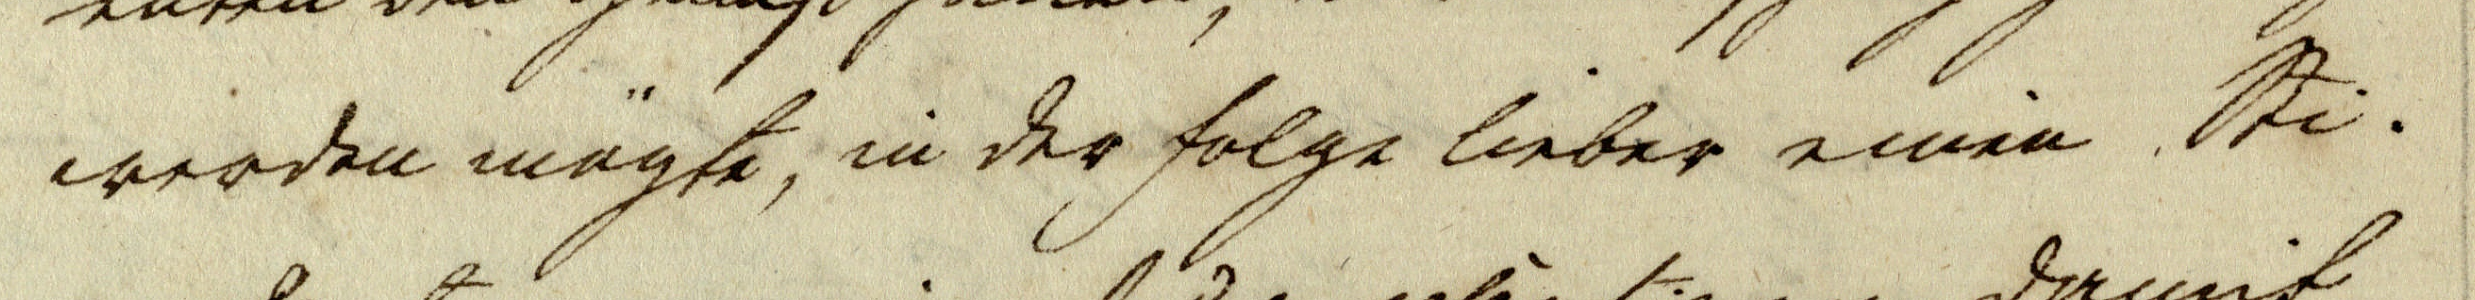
werden mögte, in der Folge lieber einen Sti¬
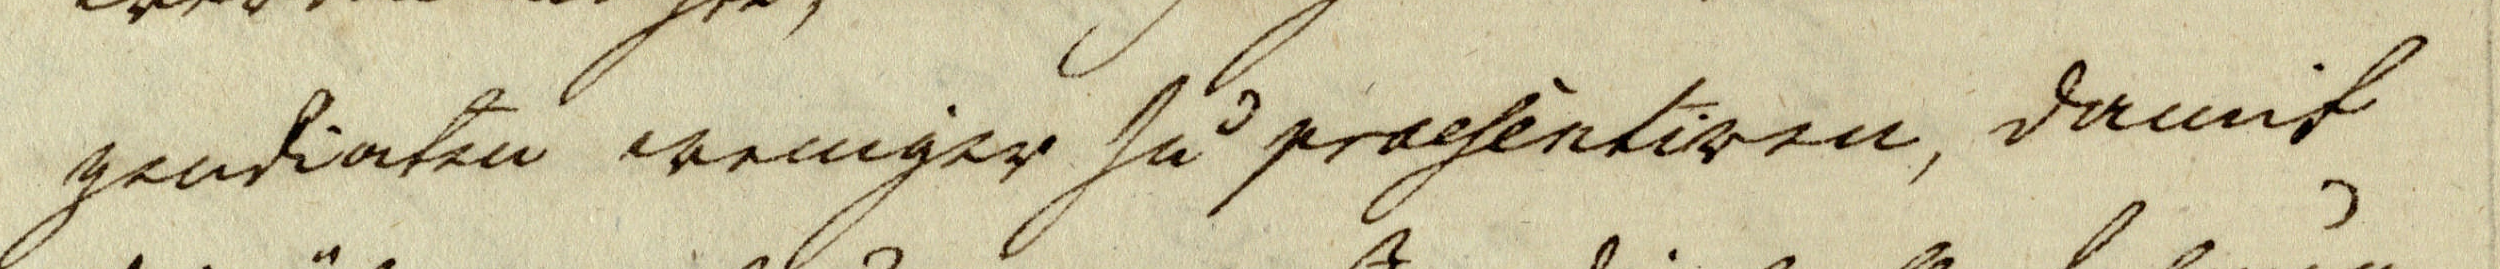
pendiaten weniger zu praesentiren, damit
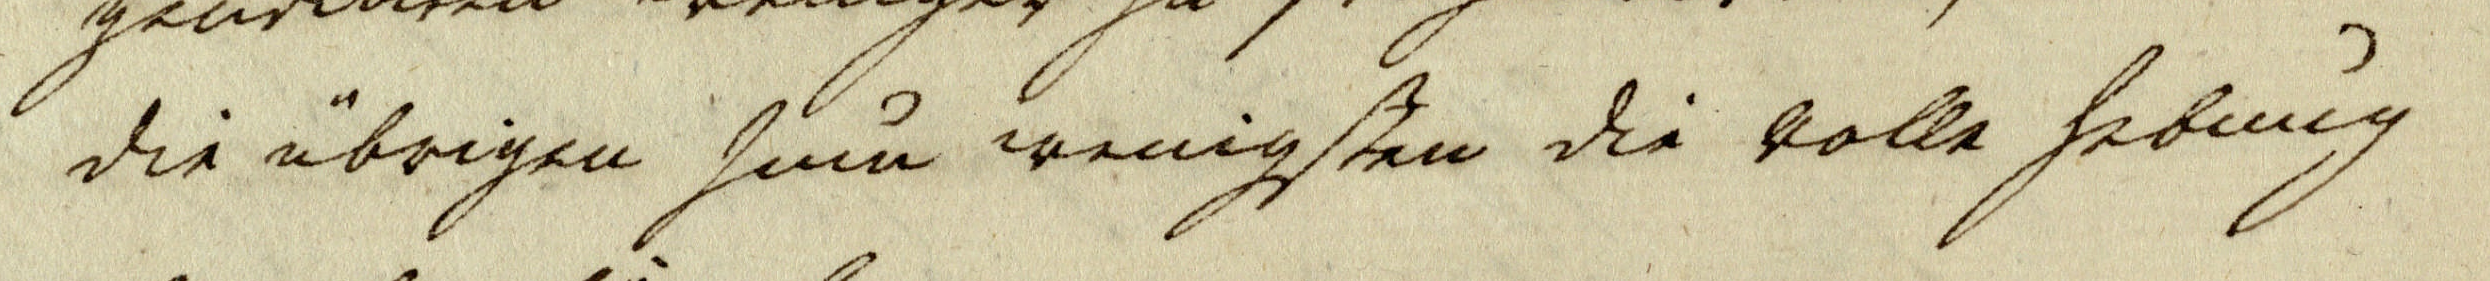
die übrigen zum wenigsten die volle Hebung
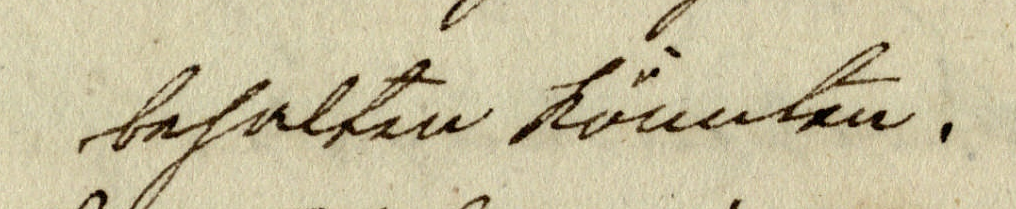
behalten könnten.
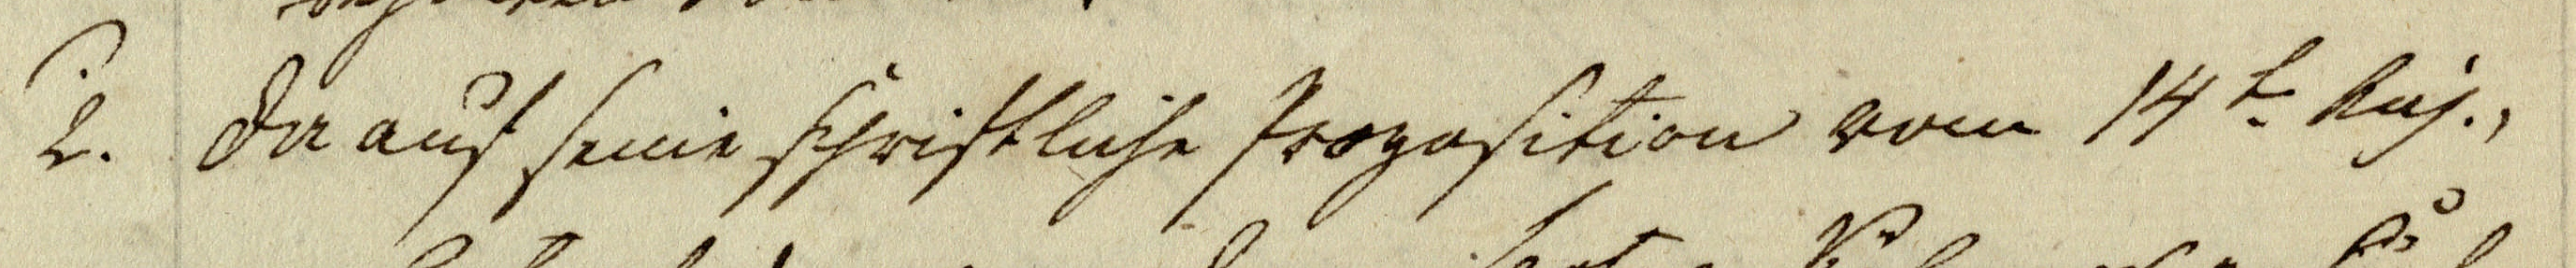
2. Da auf seine schriftliche Proposition vom 14. t. huj.,
